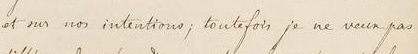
et sur nos intentions; toutefois je ne veux pas
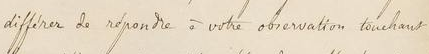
différer de répondre à votre observation touchant
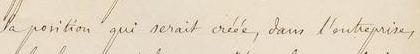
la position qui serait crée, dans l'entreprise,
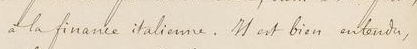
la finance italienne. Il est bien entendu,
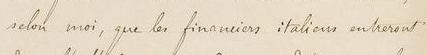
selon moi, que les financiers italiens entreront
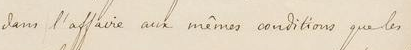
dans l'affaire aux mêmes conditions que les
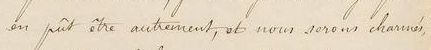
en pût être autrement, et nous serons charmés,
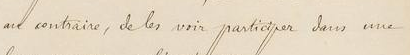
au contraire, de les voir participer dans une
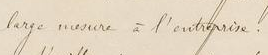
large mesure à l'entreprise.
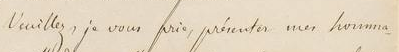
Veuillez, je vous prie, présenter mes homma-
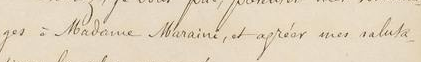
ges à Madame Maraini, et agréer mes saluta-
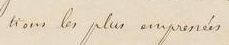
tions les plus empressées
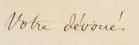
Votre dévoué.
